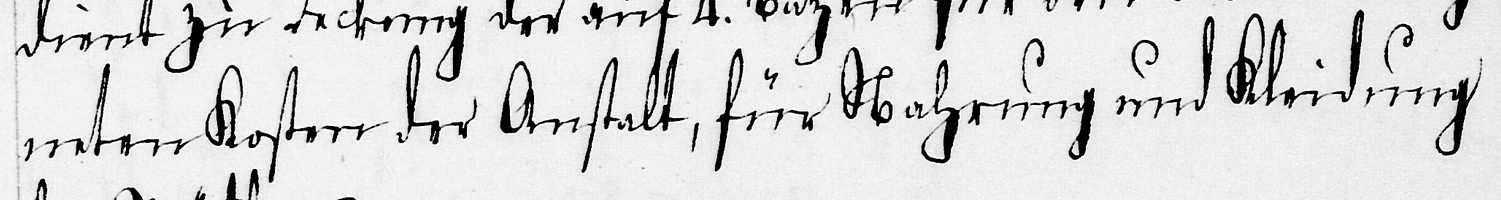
neten Kosten der Anstalt, für Nahrung und Kleidung
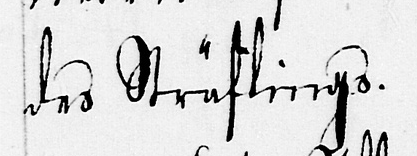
des Sträfling¬
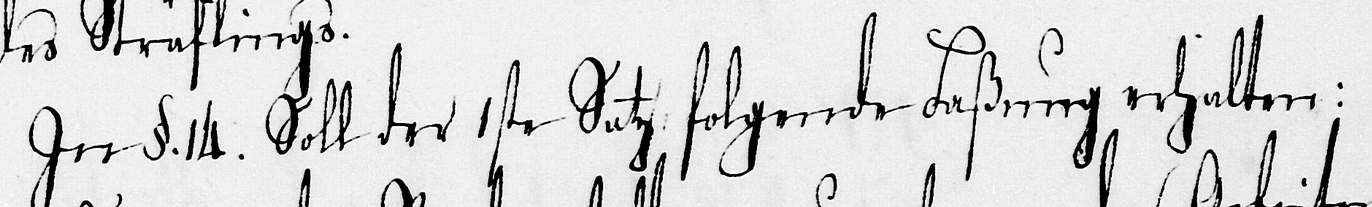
§. 14. Soll der 1ste Satz folgende Faßung erhalten:
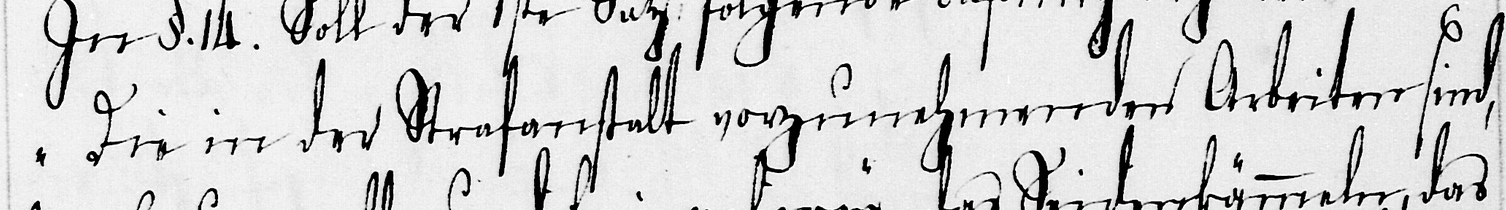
„Die in der Strafanstalt vorzunehmenden Arbeiten sin¬
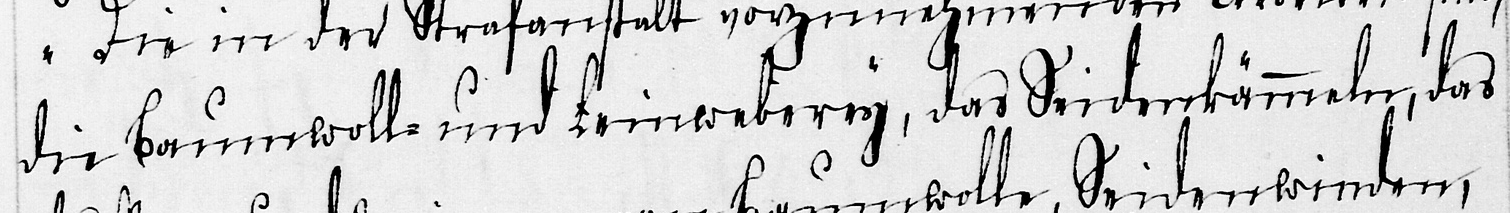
die Baumwoll- und Leinenweberey, das Seidenkämmeln, das
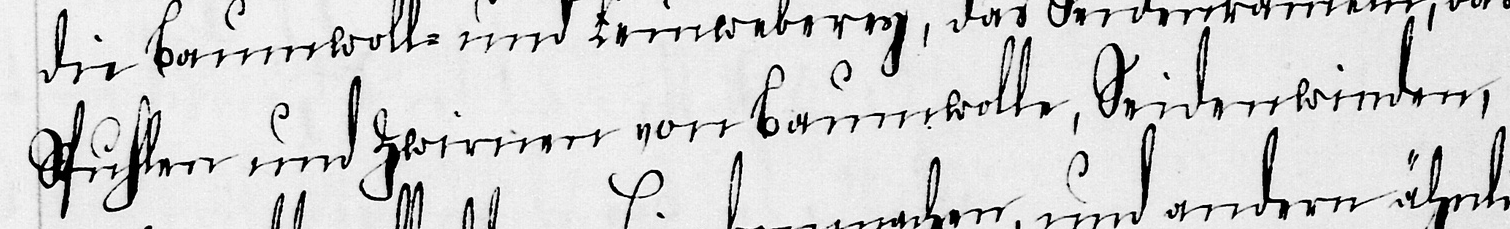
Spuhlen und Zwirnen von Baumwolle, Seidenwinden,
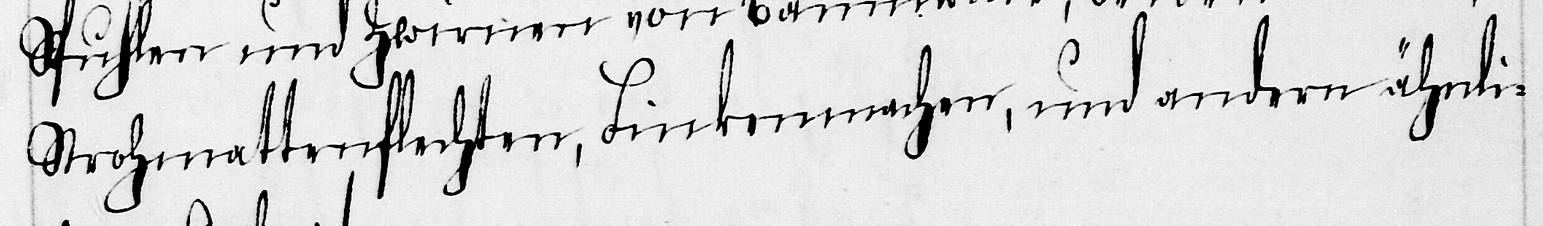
Strohmattenflechten, Finkenmachen, und andere ähnli¬
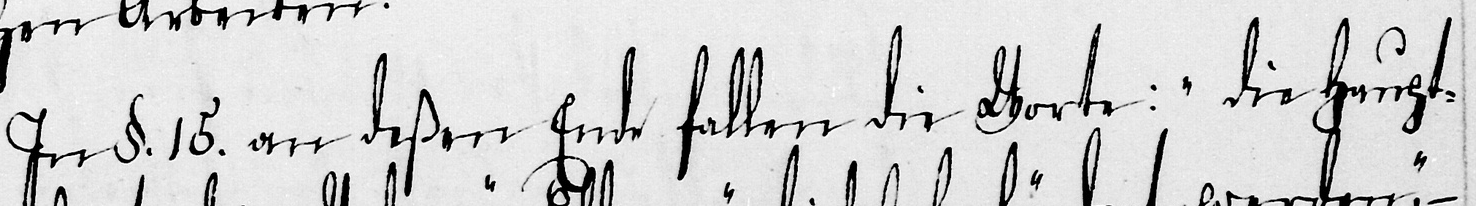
In §. 15. an deßen Ende fallen die Worte: „Die Haupt¬
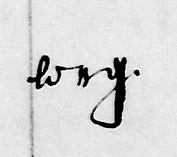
weg.
